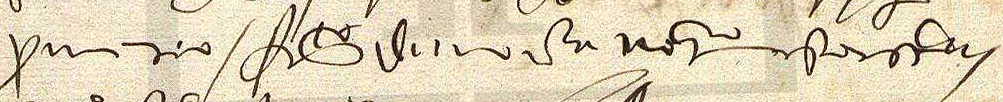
ꝓmeteo / frco de moura notro esto esc̄uj
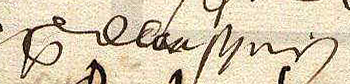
e p̄o ella asynej
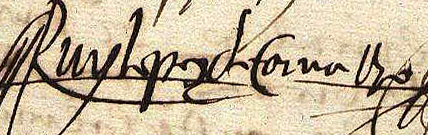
Ruy lopez de Carualho
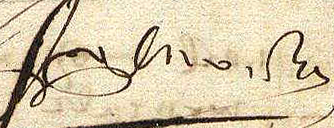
frco de moura
